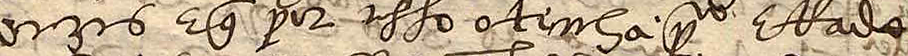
vezes E q̄ por isso o tinha p̄o ERado
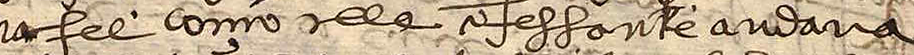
na fee como elle cōfessante andaua
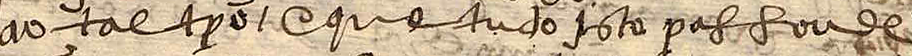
ao tal tpō / e que tudo jsto passou de
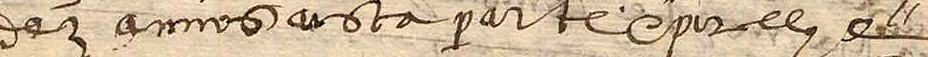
dez̄ annos a esta parte e por lhe //
